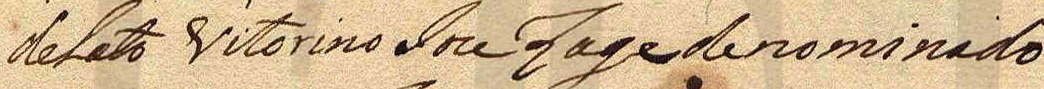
deLato Vitorino Ioze Lage de nominado
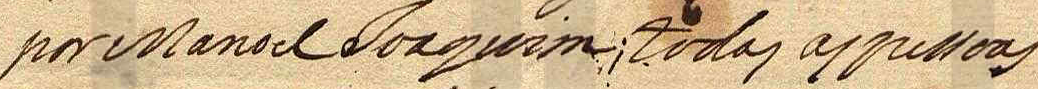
por Manoel Ioaquim; todas as pessoas
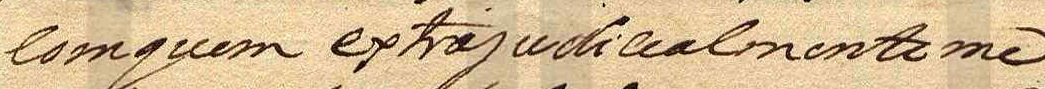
com quem extrajudicialmente me
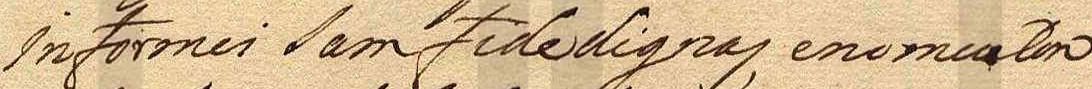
informei sam fidedignas, e nomeo con
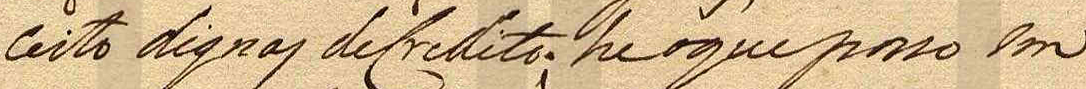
ceito dignas de Credito; he o que passo im
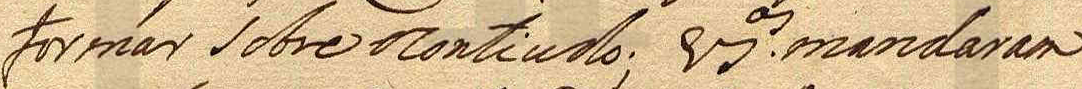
formar sobre o contiudo; vs.as mandaram
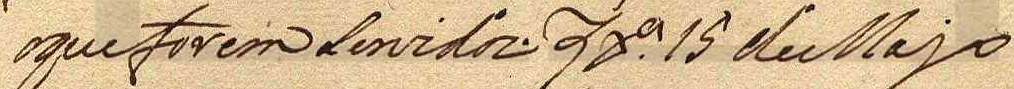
o que forem servidoz. Lx.a 15 de Majo
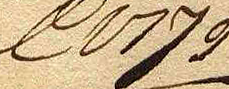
d̄1779
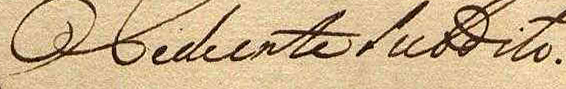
Obediente subdito.
